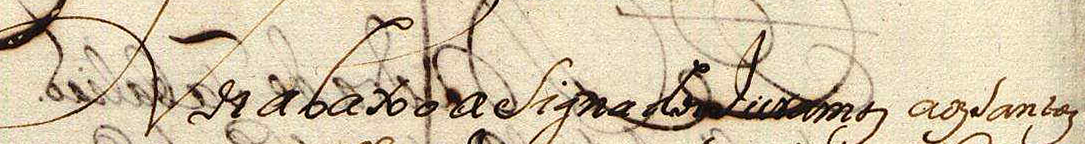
Nos abaxo asignados Iuramos aoz Santoz
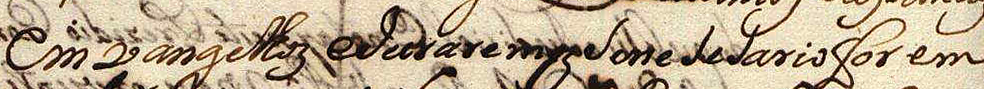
emvangelhoz e Iuraremos se nesesario for em
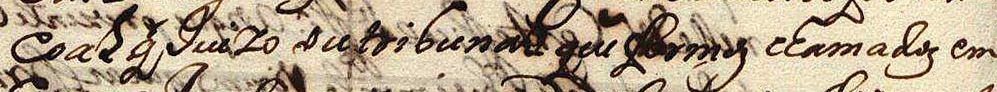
coalqr Iuizo ou tribunal que formoz chamadoz em
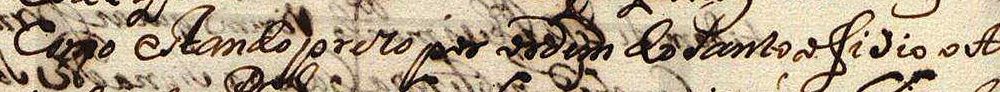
Cargo estando prezo por ordem do santo offisio o A
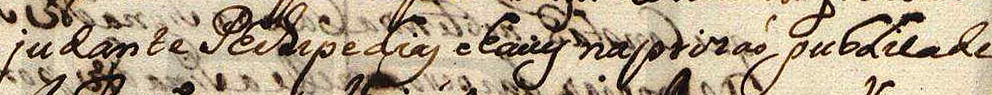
judante Phelipe dias chaues na prizaõ publica de
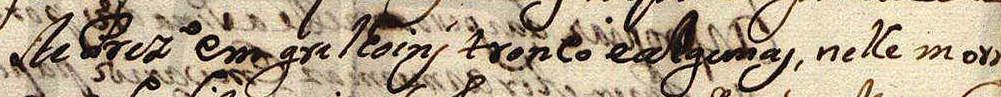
ste Prezo em grelhoins tronco e algemas, nelle morr
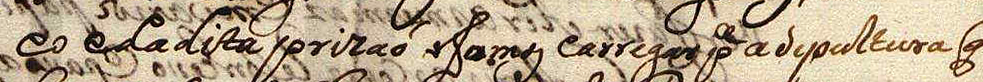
eo, e da dita prizaõ o fomos carregar pa a sepultura q̄
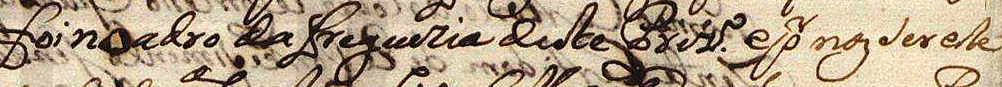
foi no adro da freguezia deste Prez.o e p.r noz ser este
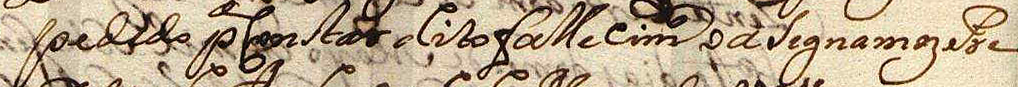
pedido pa Constar dito fallecim.to o asignamoz Pre
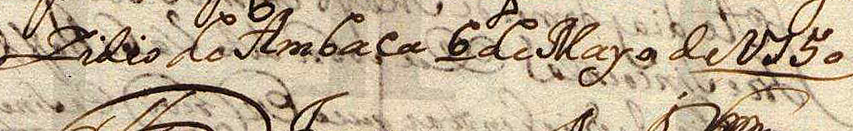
Zidio de Ambaca 6 de Mayo de 1750
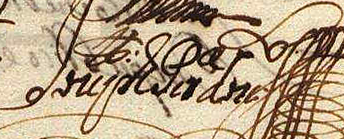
Iozeph Pera dos stos
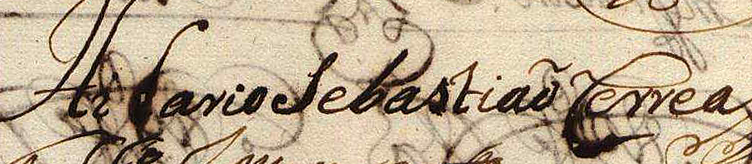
Hilario Sebastiaõ Correa
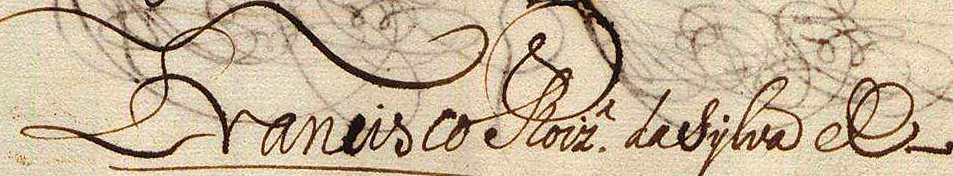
Francisco Roiz̄ da Sylva
